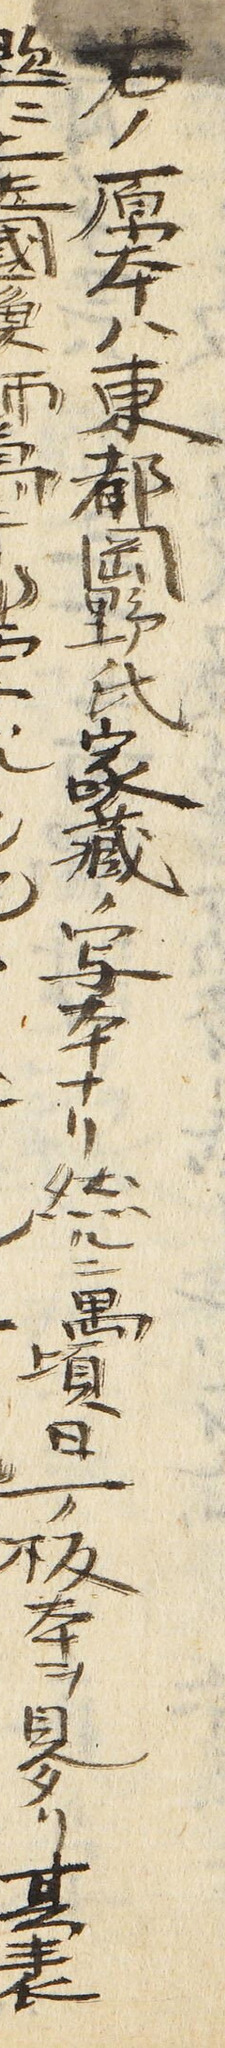右ノ原本ハ東都岡野氏家蔵ノ写本ナリ然ルニ頃日丁版本ヲ見タリ其表
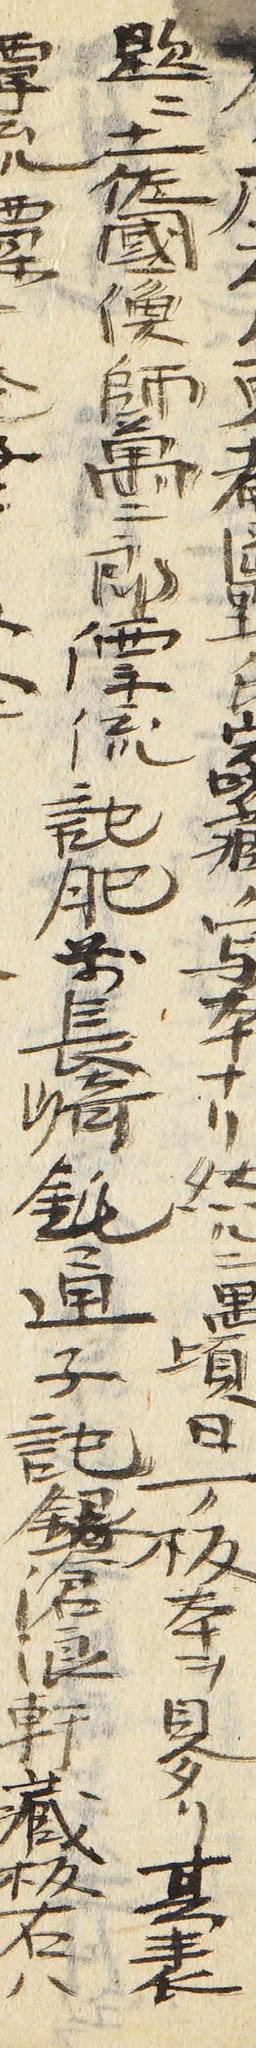題ニ土佐国漁師萬二郎漂流記肥前長崎通子記録滄浪軒蔵板右ハ
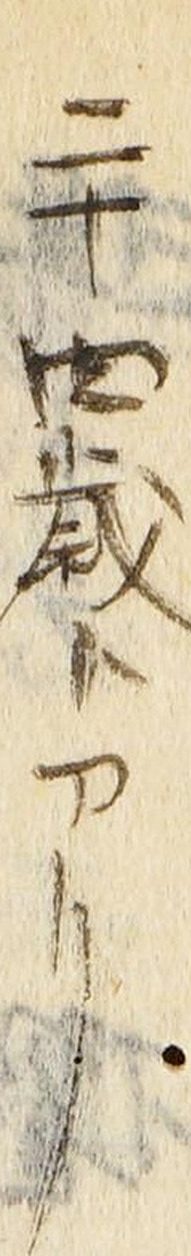二十四歳トアリ
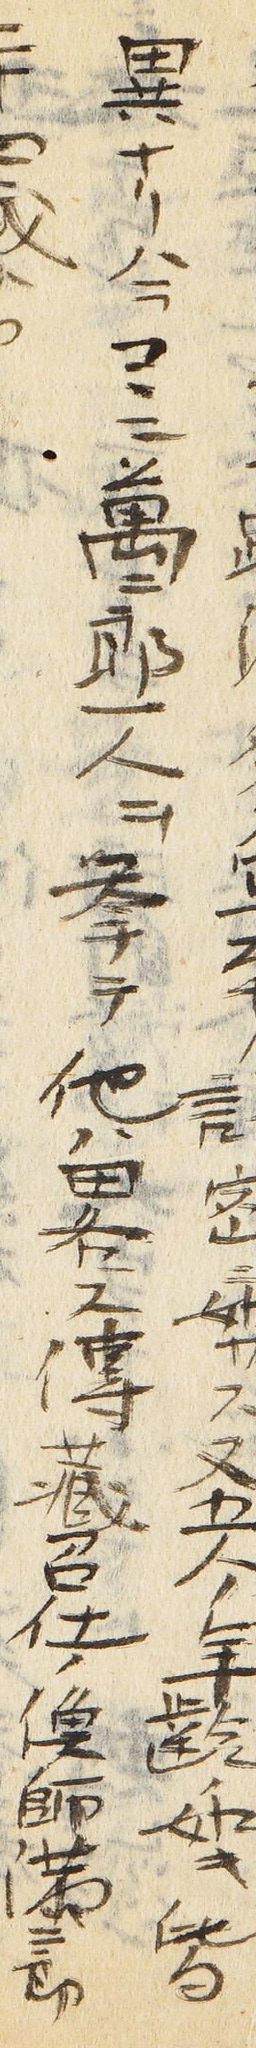異ナリ今コヽニ萬二郎一人ヲ挙テ他ハ略ス傳蔵召仕ノ漁師満二郎
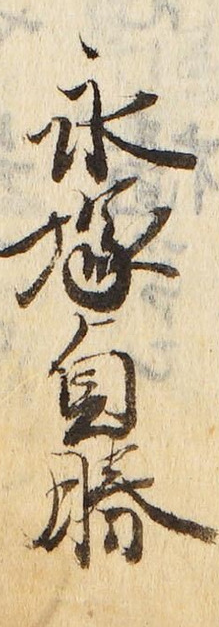永塚貞勝
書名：漂流記聞
